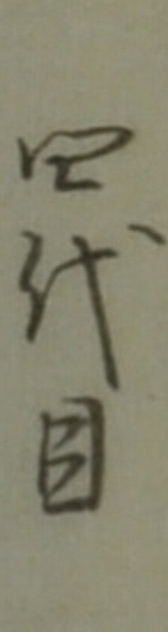四代目
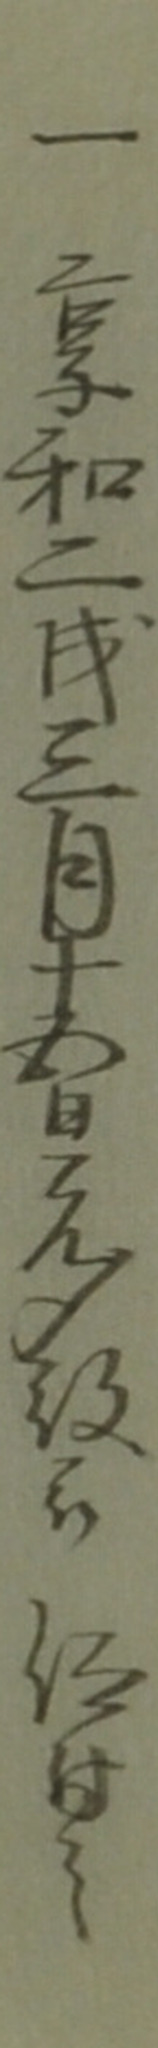一享和二戌三月十五日元〆役被仰付之
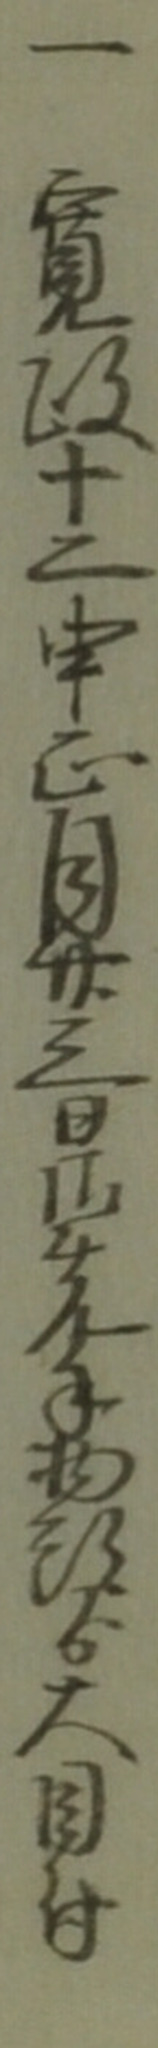一寛政十二申正月廿三日御先手物頭ゟ大目付
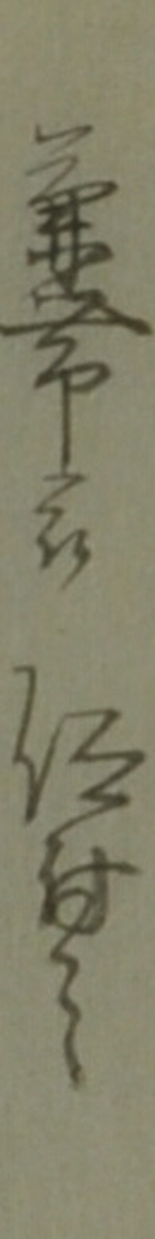兼帯被仰付之
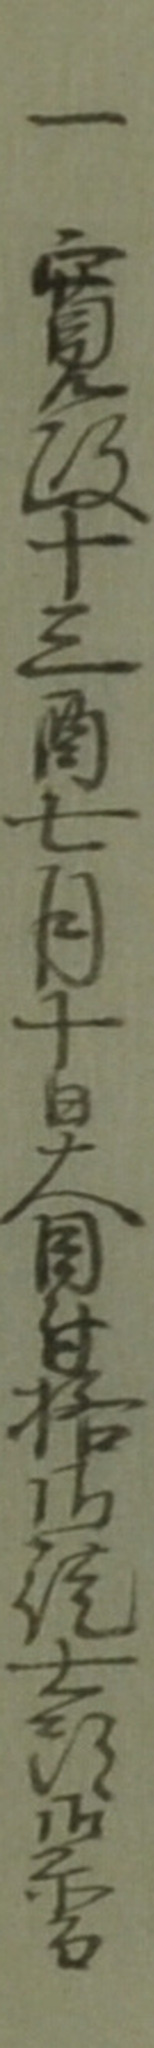一寛政十三酉七月十日大目付格御徒士頭御普
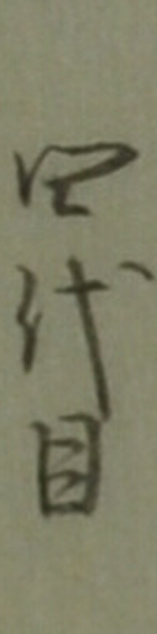四代目
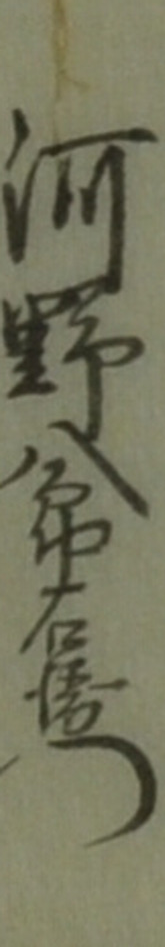河野八郎右衛門
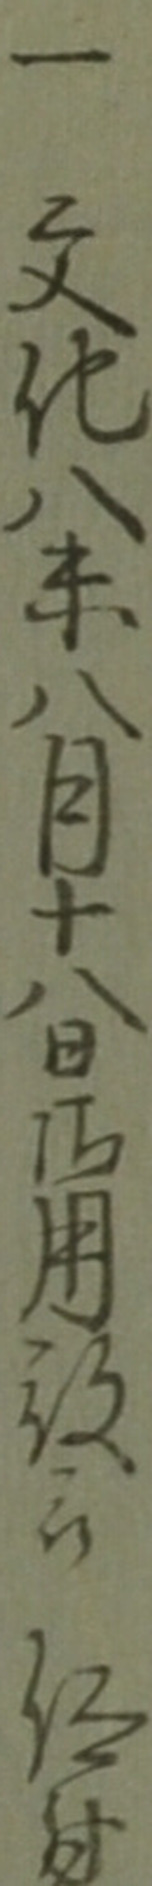一文化八未八月十八日御用役被仰付之
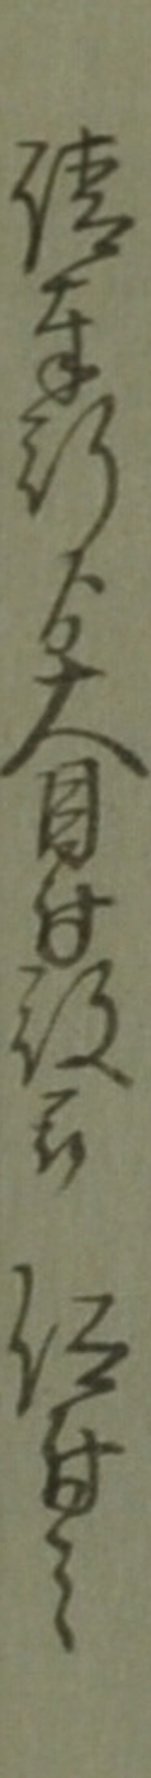請奉行ゟ大目付役被仰付之
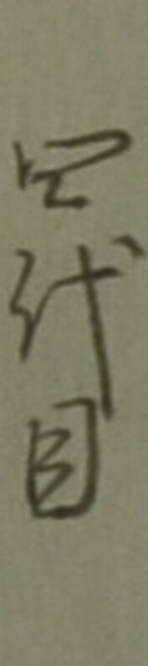四代目
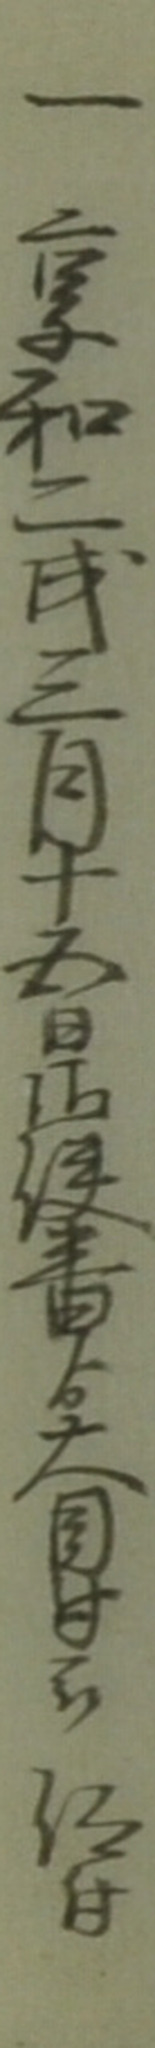一享和二戌三月十五日御使番ゟ大目付被仰付
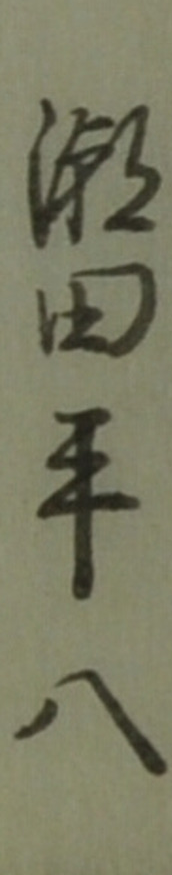潮田平八
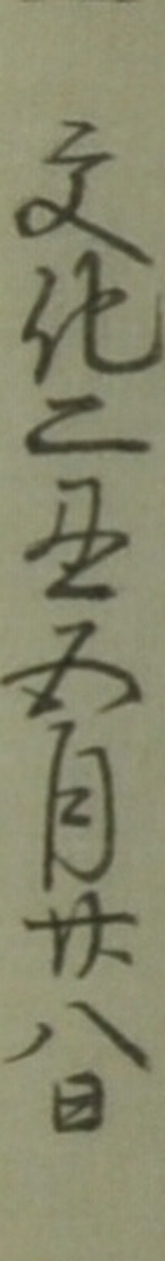一文化二丑五月廿八日

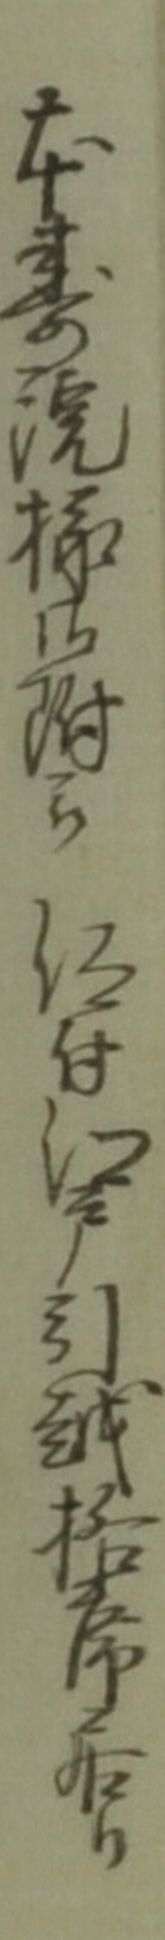本寿院様御附被仰付江戸引越格席居リ
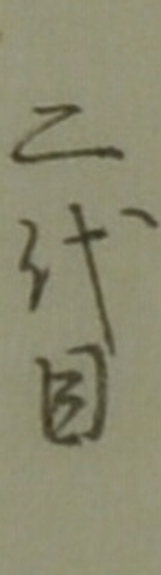二代目
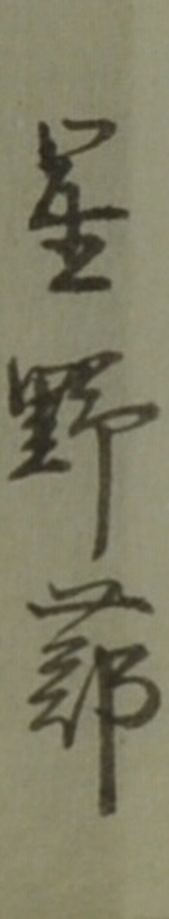星野蔀
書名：諸御役代々録（三）
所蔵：伊那市立高遠町図書館・合同会社AMANE
